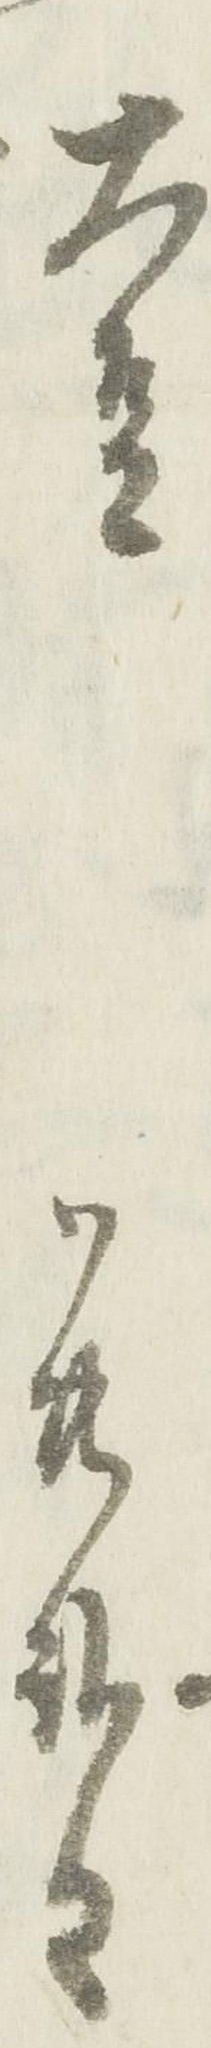大豆同廿弐匁
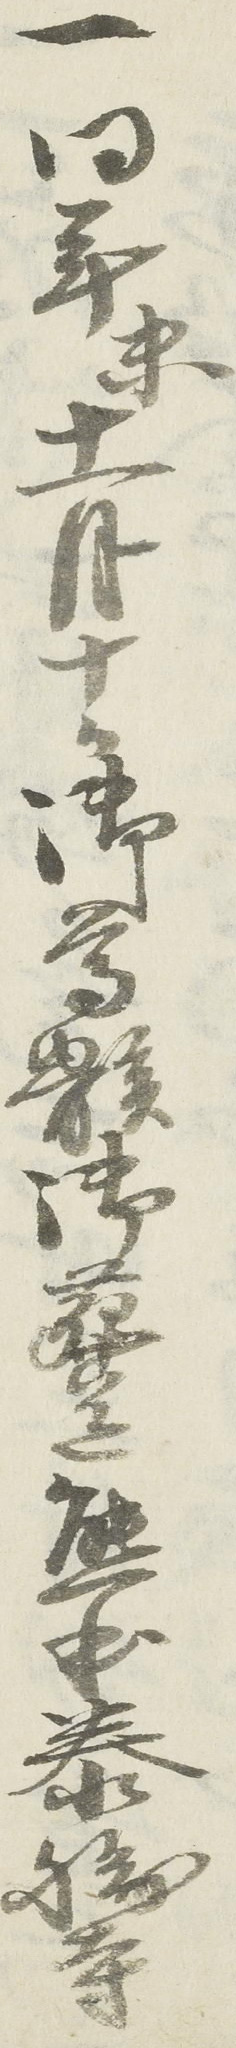一同年未十一月十日御尊骸御葬送熊本泰勝寺
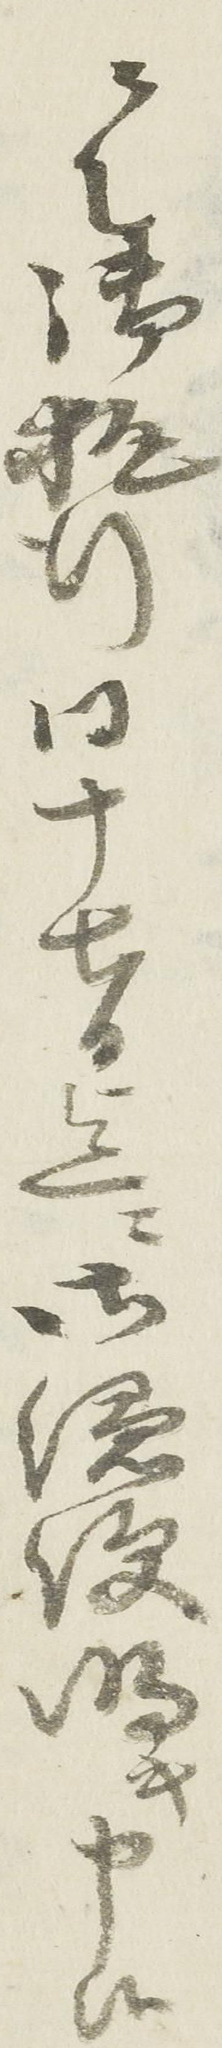ニて御執行同十七日迄ニ御穏便明き申候
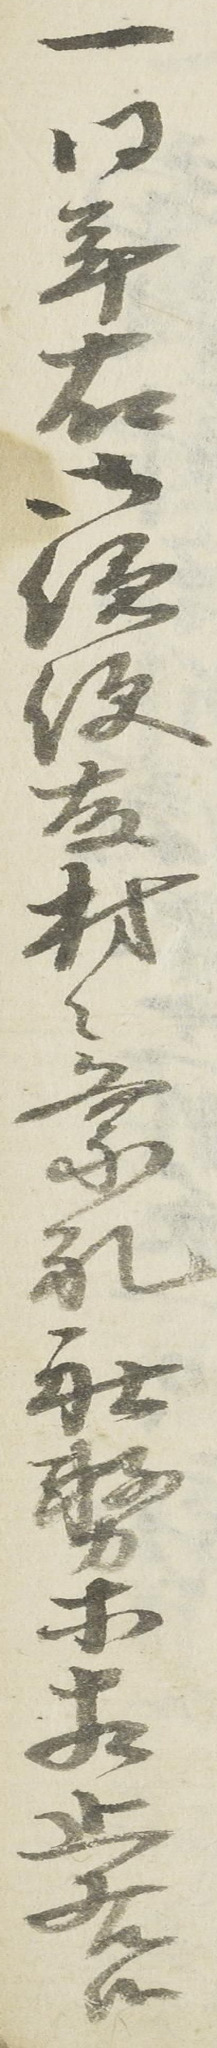一同年右御穏便故村々祭礼社勢等相止居候

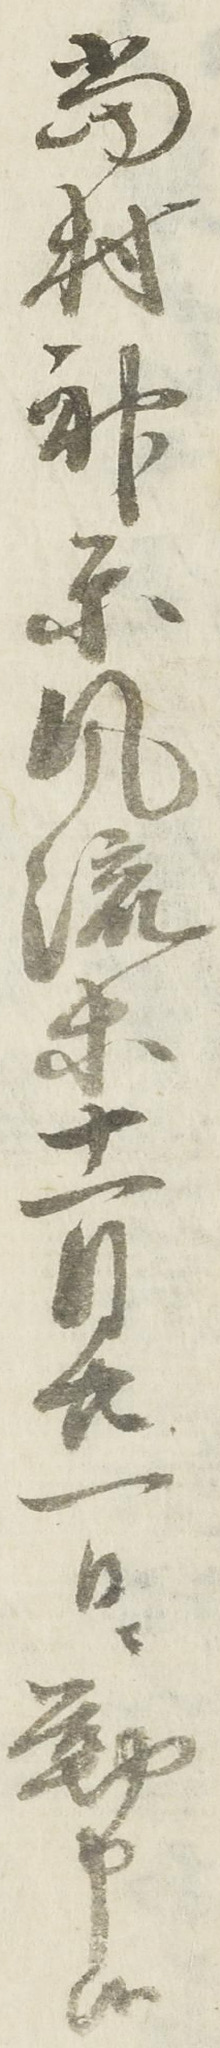当村神原風流等十一月廿一日ニ勤申候
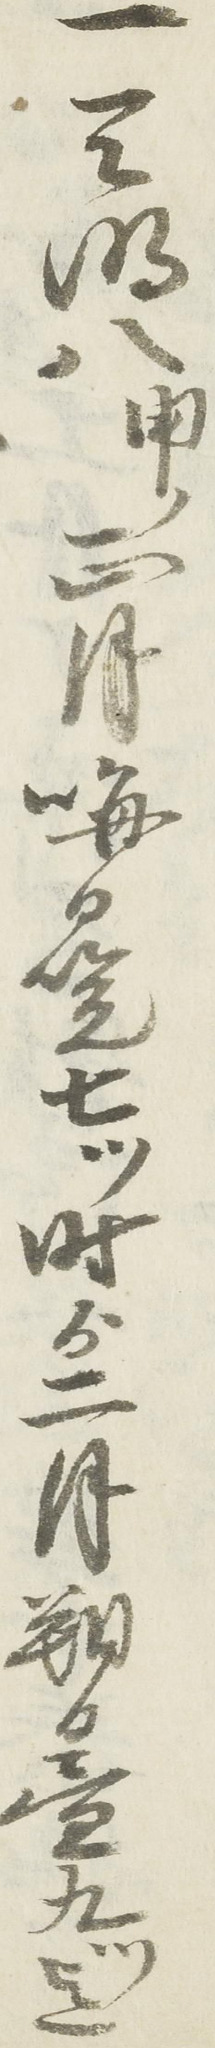一天明八申ノ正月晦日晩七ツ時ゟ二月朔日昼九ツ迄
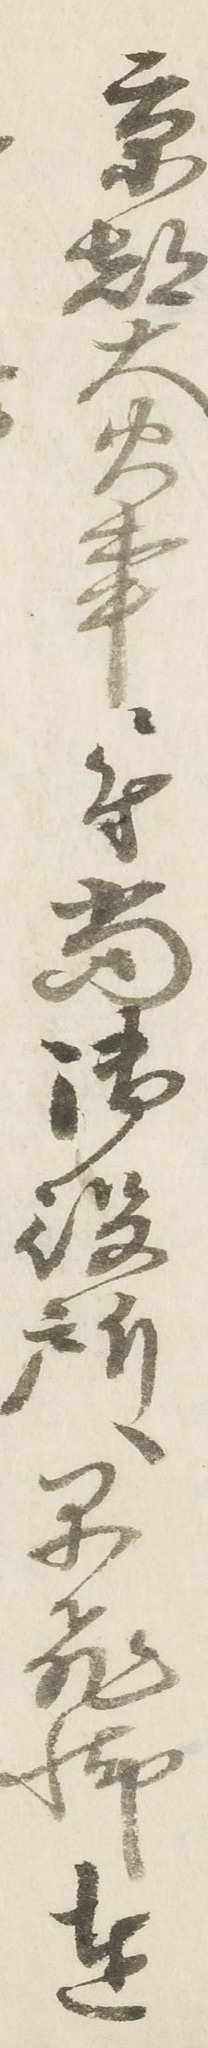京都大火事ニ付当御役所へ早飛脚達
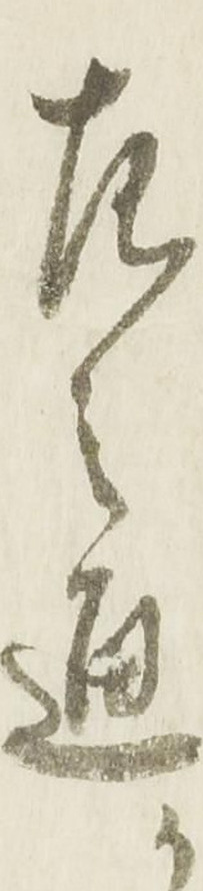左之通り
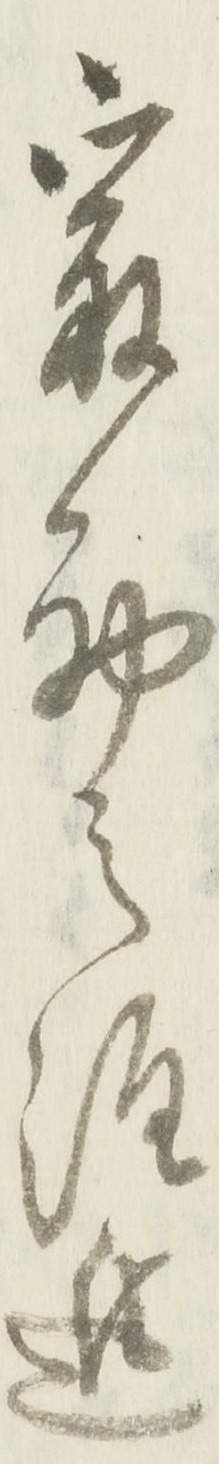最初之注進
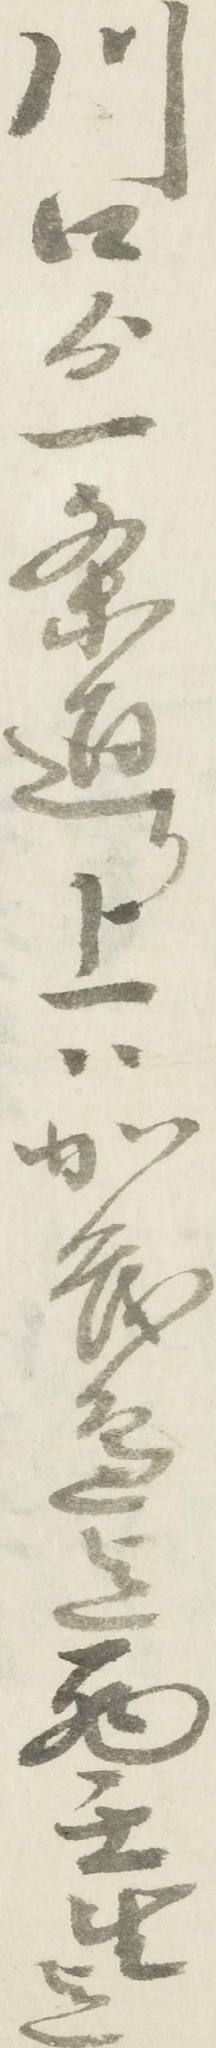川口ゟ一条通り上は加茂辺迄西壬生迄
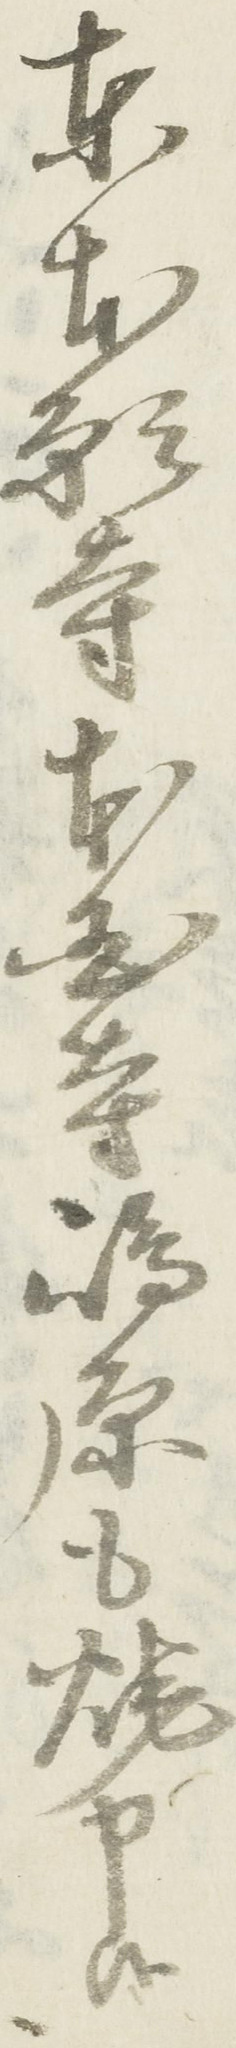東本願寺本国寺嶋原も焼申候
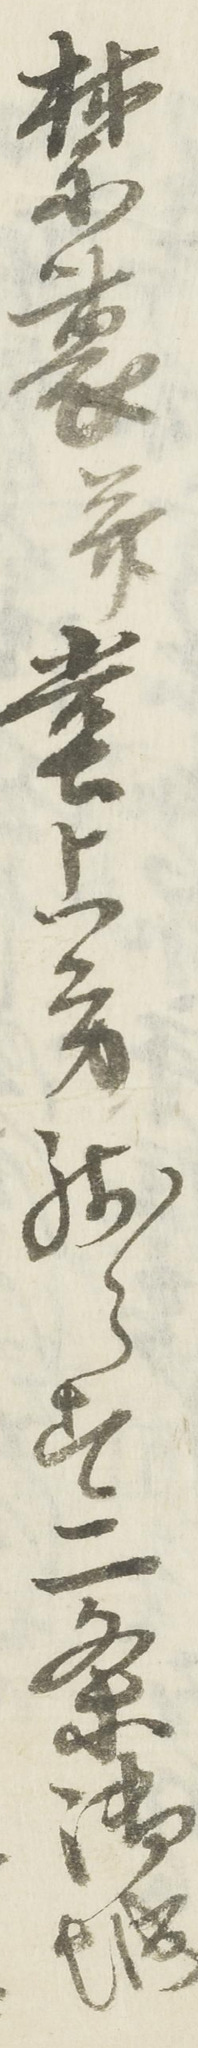禁裏幷堂上方残らす二条御城
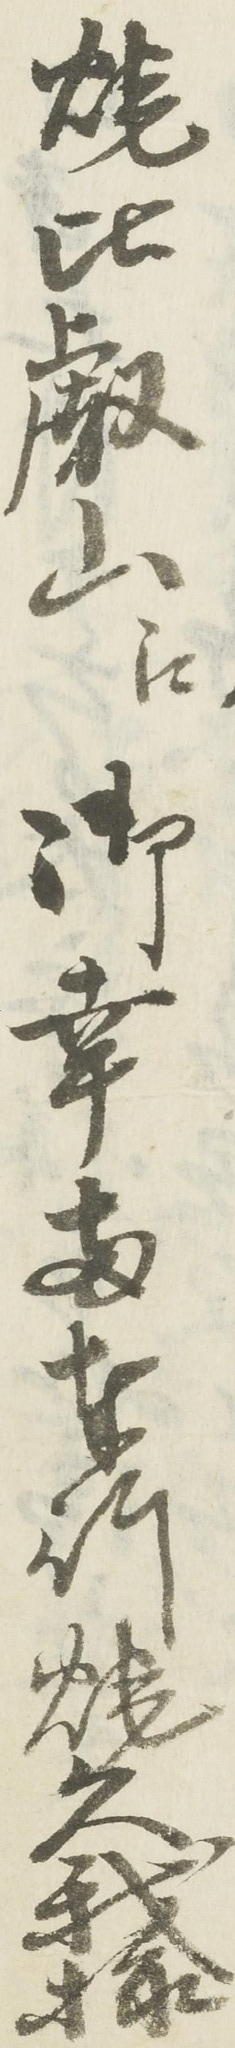焼比叡山え御幸両奉行焼久我様も
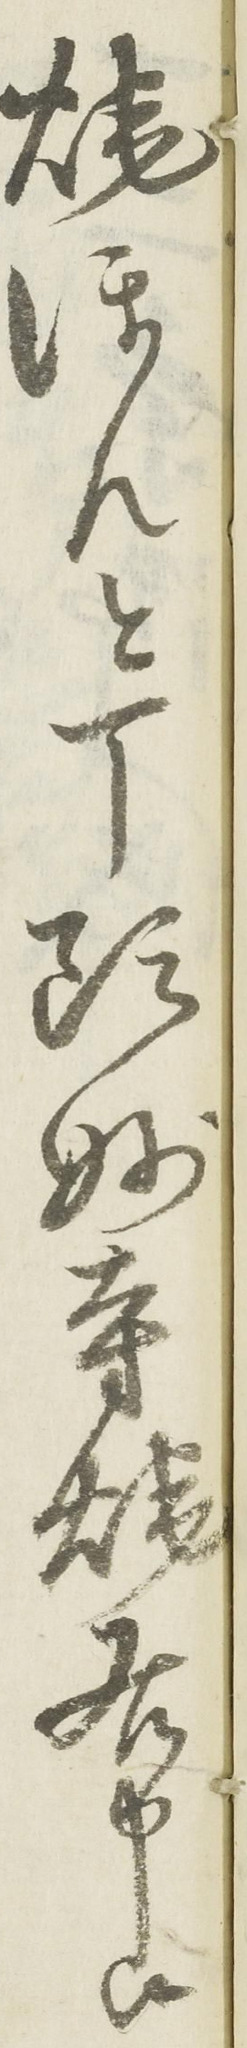焼ほんと丁頭妙寺焼居申候
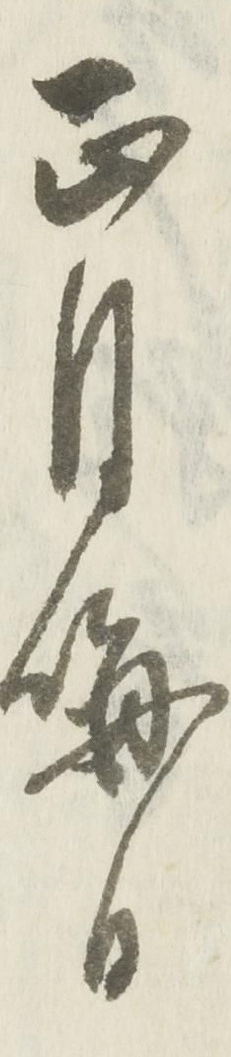正月晦日
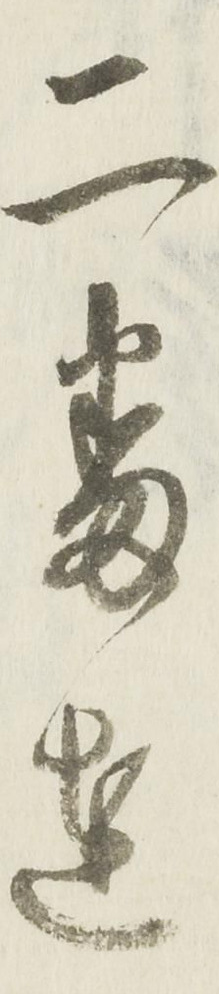二番達
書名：後見笑
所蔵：東京大学地震研究所図書室 Earthquake Research Institute Library, The University of Tokyo, JAPAN
